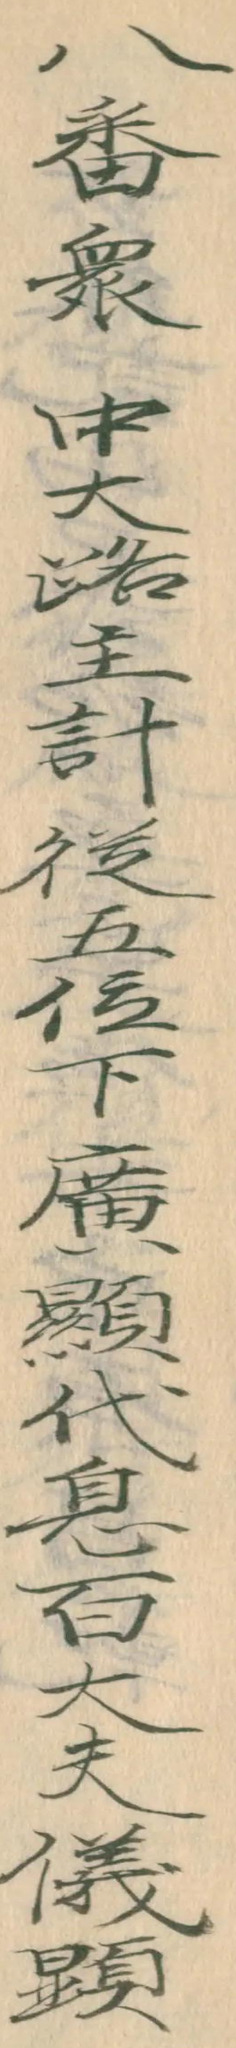八番衆中大路主計従五位下広顕代息百大夫儀顕
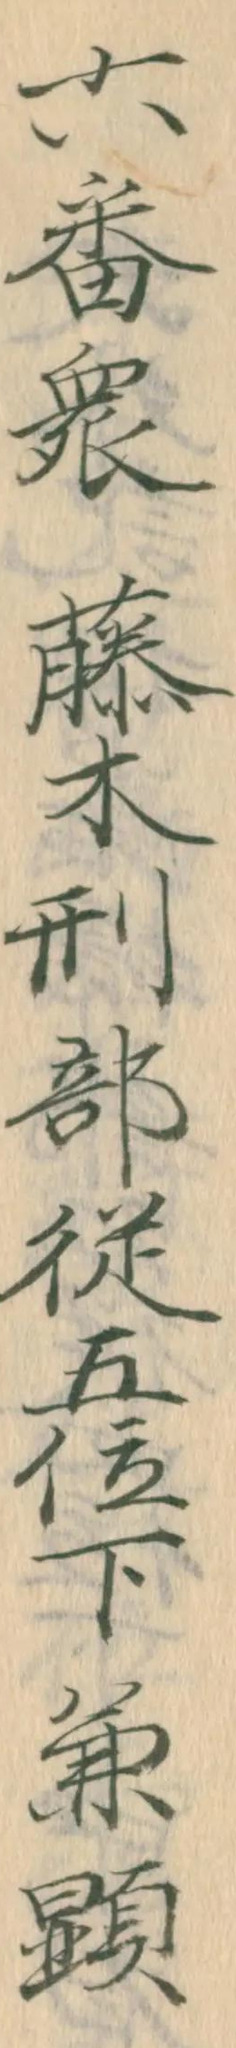六番衆藤木刑部従五位下兼顕
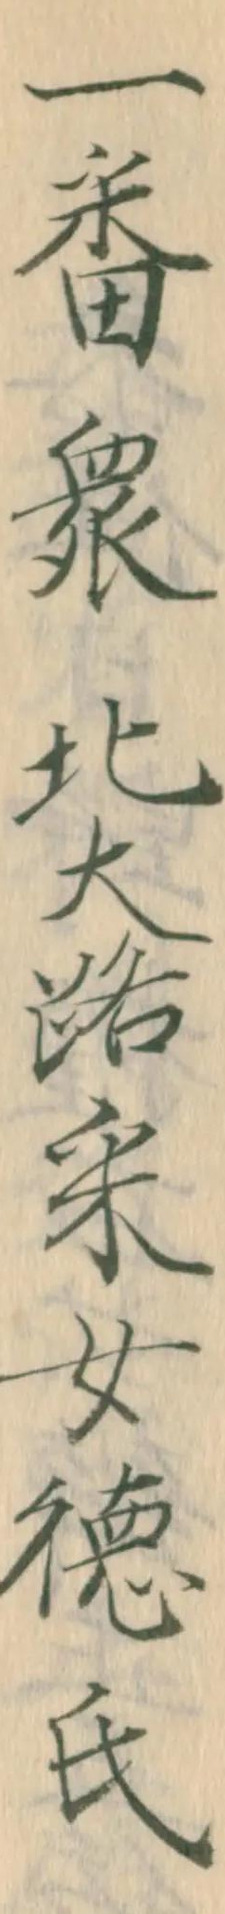一番衆北大路采女徳氏
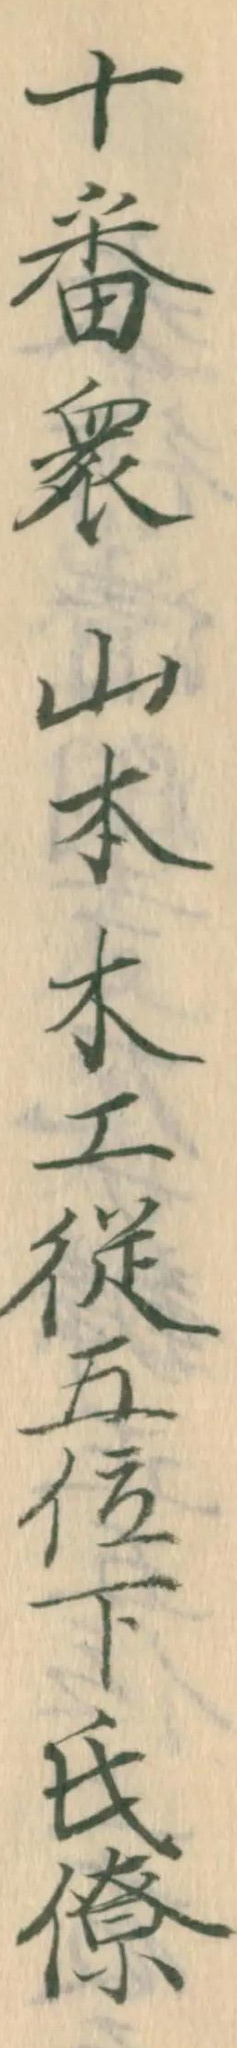十番衆山本木工従五位下氏僚
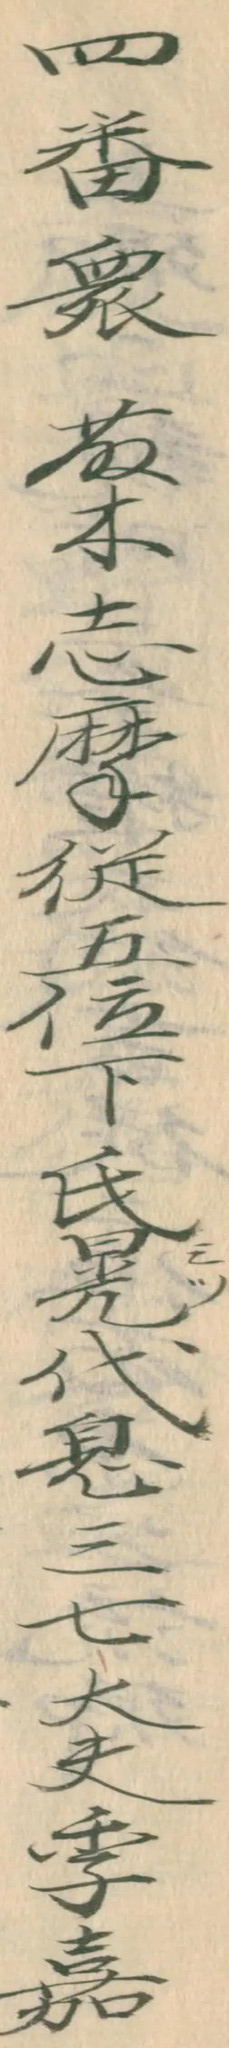四番衆藤木志摩従五位下氏晃代息三七大夫李嘉
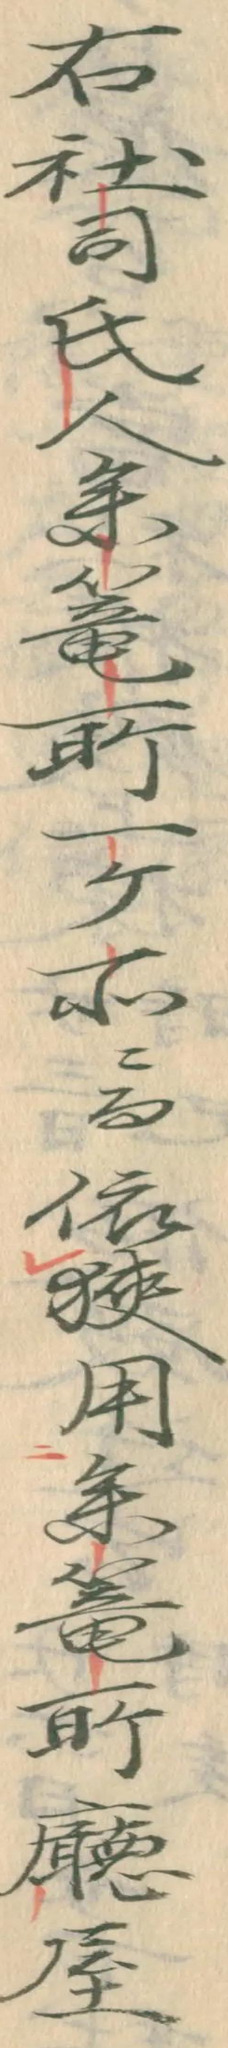右社-司氏参-篭-所一-ケ-所ニ而依狹用参-篭-所庁_屋

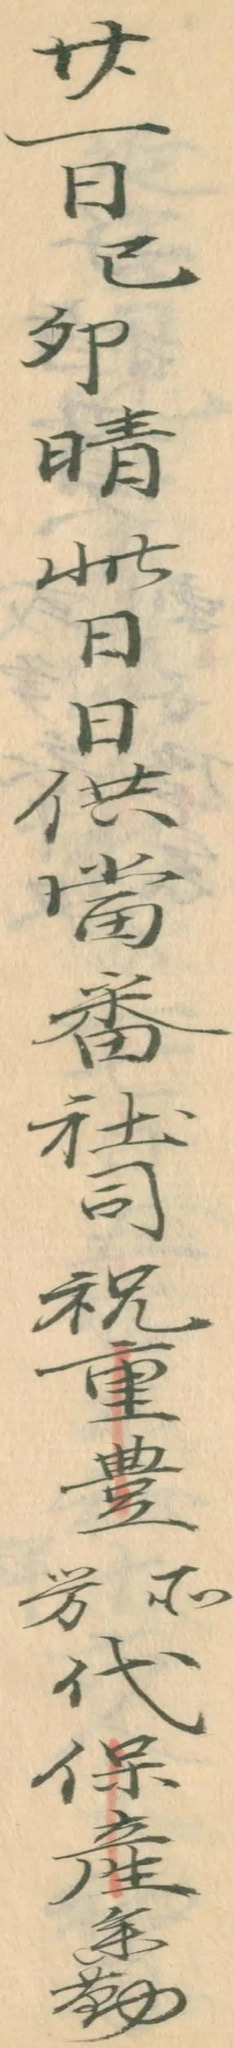廿一日己卯晴此日日供当番社司祝重豊所労代保産参勤
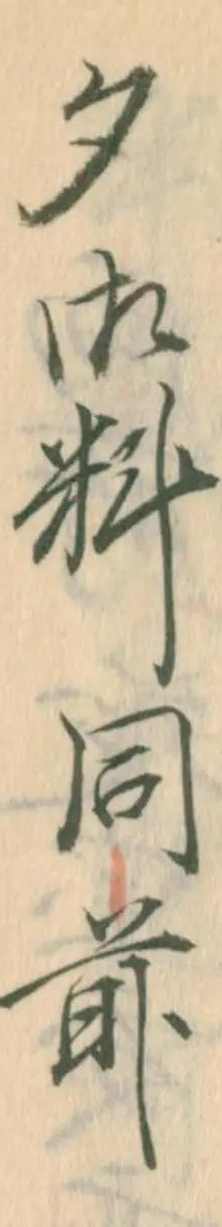夕御料同-前
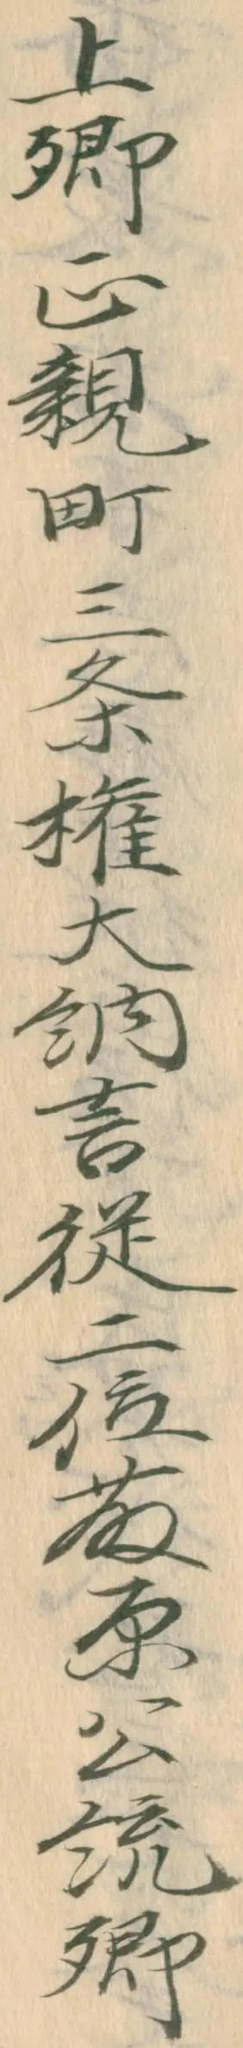上卿正親町三条権大納言従二位藤原公統卿
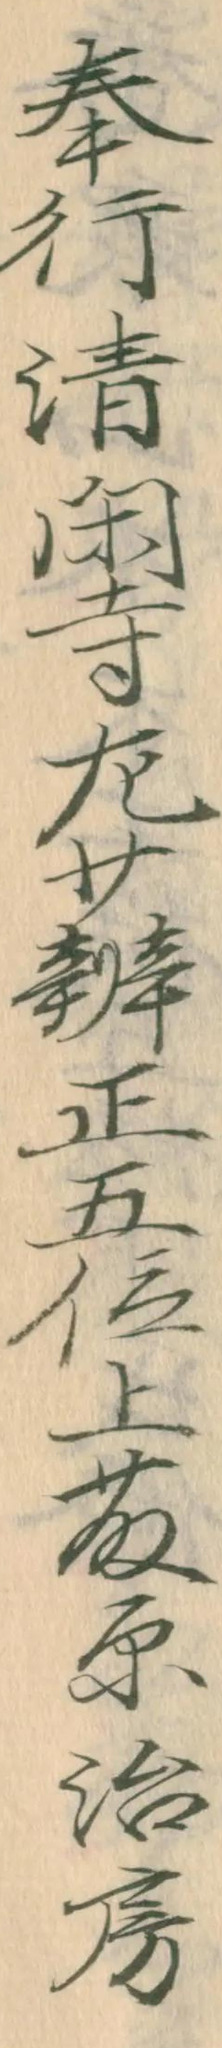奉行清閑寺左少弁正五位上藤原治房
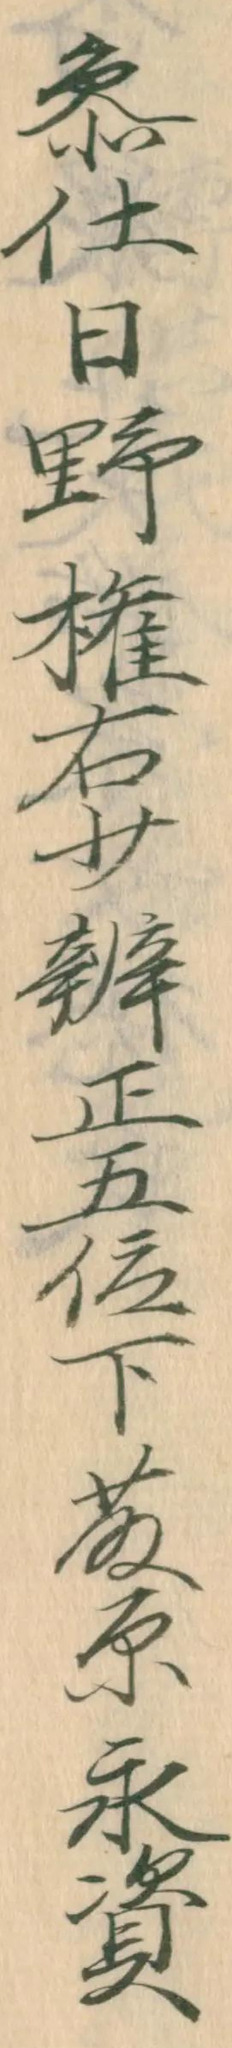参仕日野権右少弁正五位下藤原永資
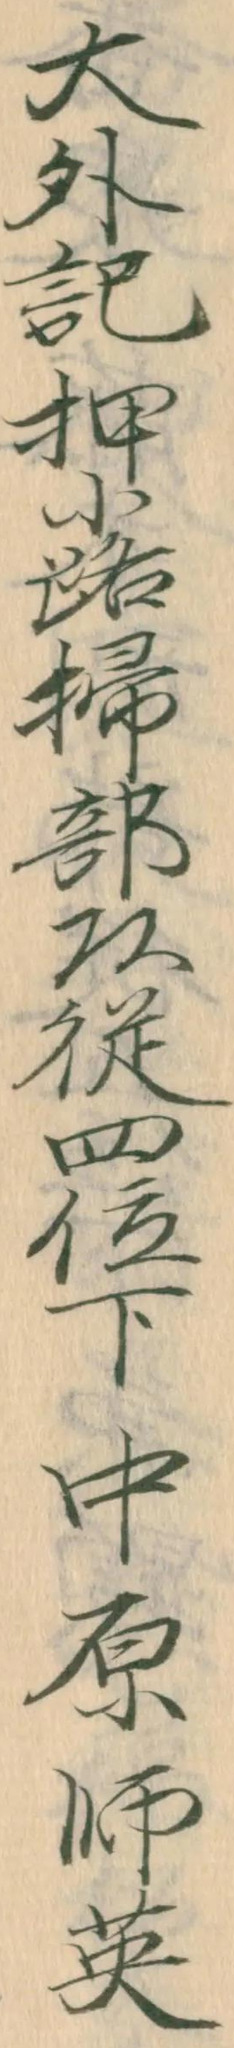大外記押小路掃部頭従四位下中原師英
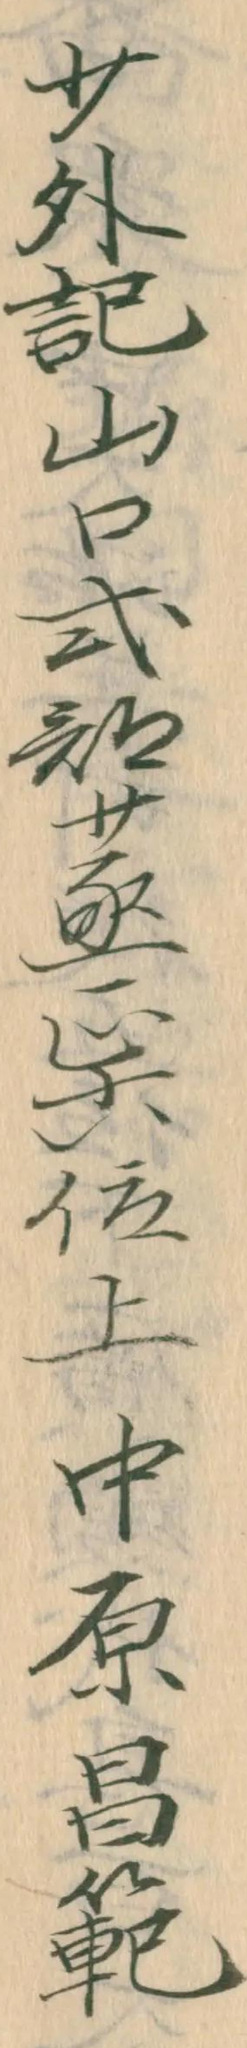少外記山口式部少丞正六位上中原昌範
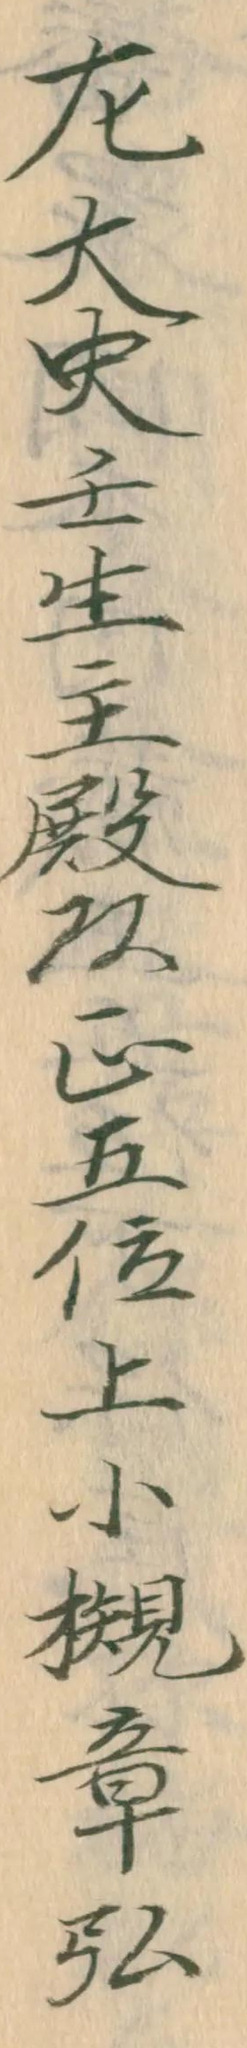左大史壬生主殿頭正五位上小槻章弘
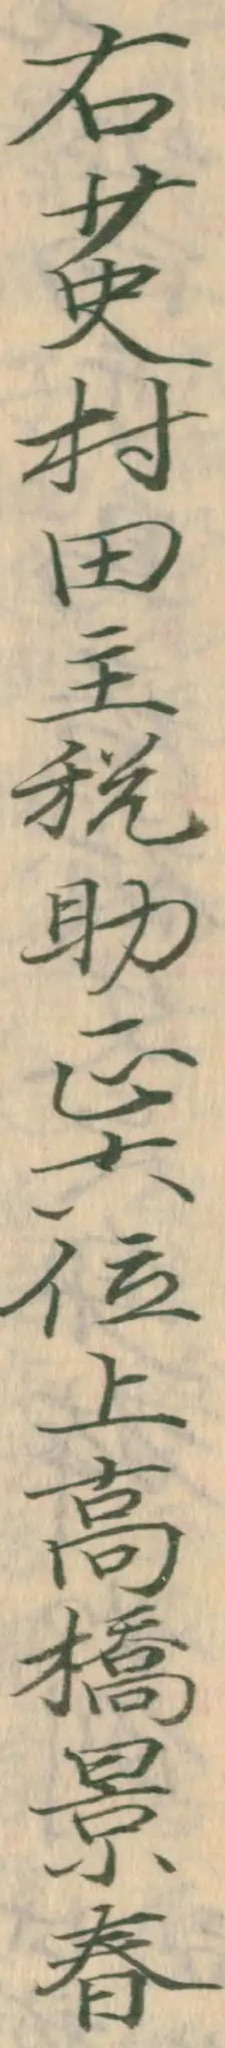右少史村田主税助正六位上高橋景春
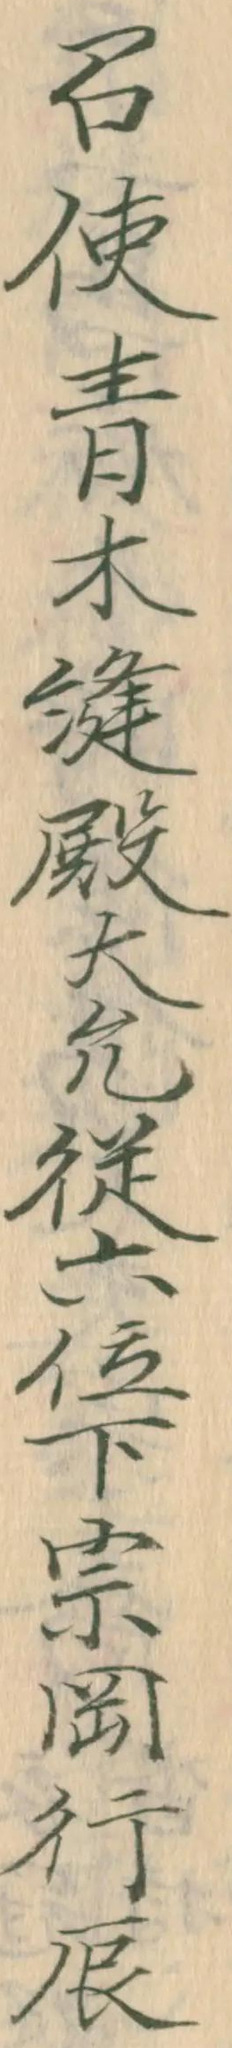召使青木縫殿大允従六位下宗岡行辰
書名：賀茂社記録. 第15冊
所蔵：国立国会図書館 National Diet Library, JAPAN
